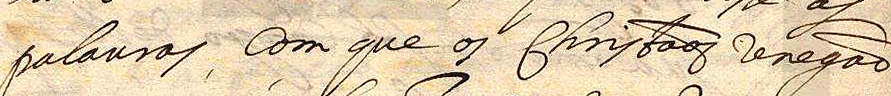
palauras com que os Christãos renegaõ
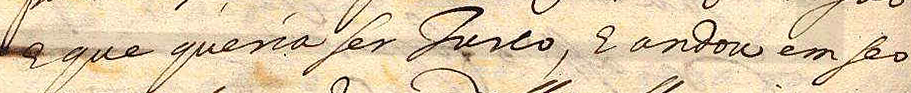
E que queria ser turco, E andou em seo
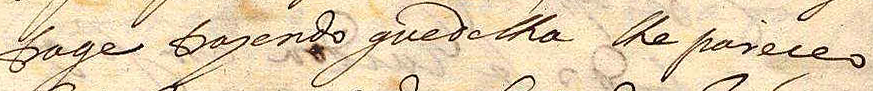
trage trazendo guedelha lhe pareceo
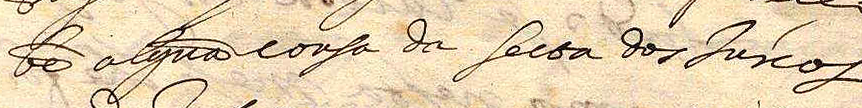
bē alguā cousa da secta dos turcos
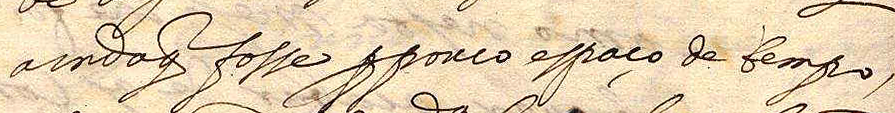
ainda q̄ fosse ꝑ pouco espaço de tempo
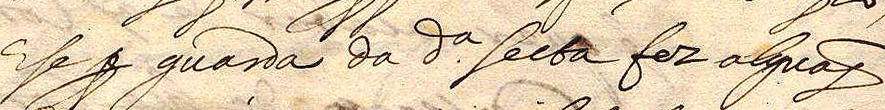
E se ꝑ guarda da d.a secta fez alguās
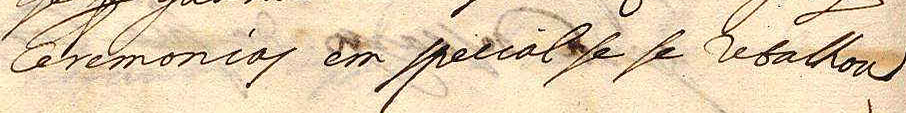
ceremonias em special se se retalhou
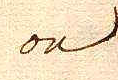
ou
